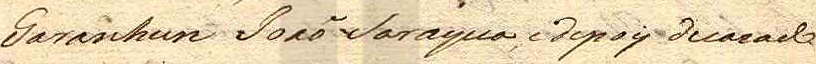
Garanhun Ioaõ Saraqua, e depois de cazado
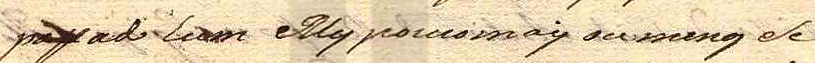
passado hum Mes pouco mais ou menos se
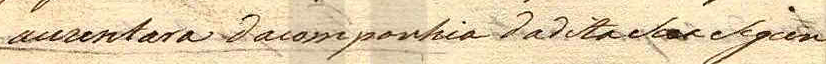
auzentara da companhia da dita sua segun
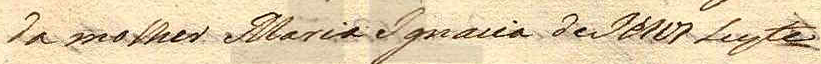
da molher Maria Ignacia de IESUS Leyte
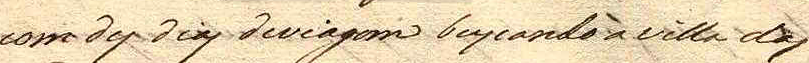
com des dias de viagem buscando a villa das
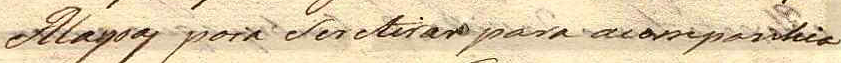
Alagoas para se retirar para a companhia
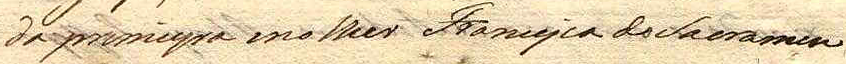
da primeyra molher Francisca do Sacramen
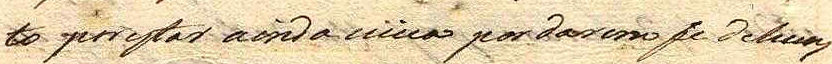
to por estar ainda viva por darem fe de huns
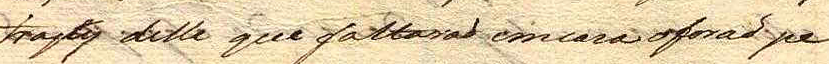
trastes delle que faltaraõ em caza o forão pe
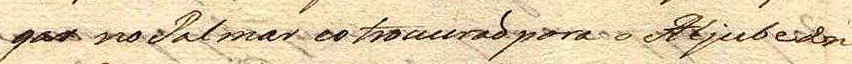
gar no Palmar e o troucerão para o Aljube on
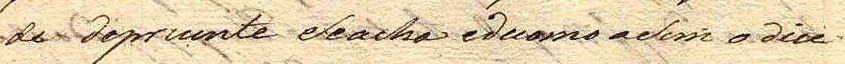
de de prezente se acha e de como asim o dice
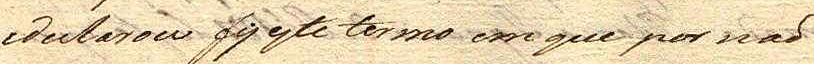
e declarou fis este termo em que por naõ
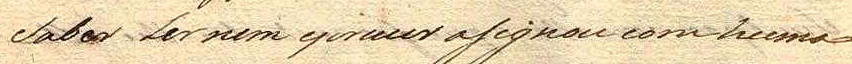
saber Ler nem escrever asignou com huma
